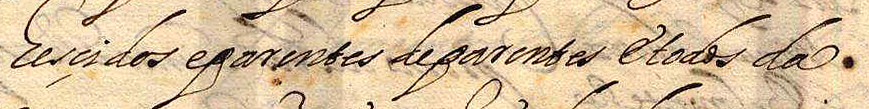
hescidos e parentes de parentes e todos da
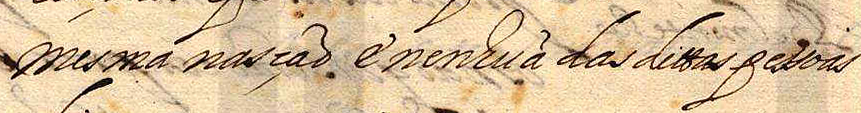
mesma nasçaõ, e nenhuā das dittas pessoas
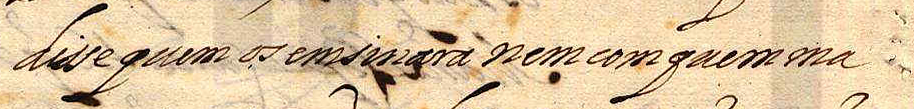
disse quem os emsinara nem com quem ma
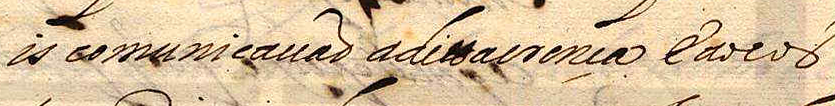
is comunicauão a ditta crença e ao cos
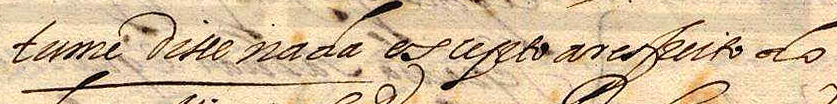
tume disse nada escepto a respeito do
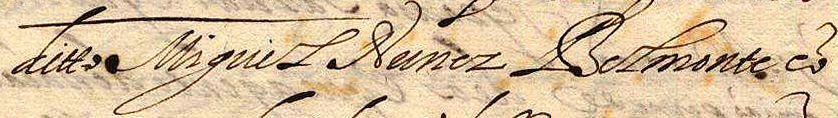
ditto Miguel Nunez Belmonte cō
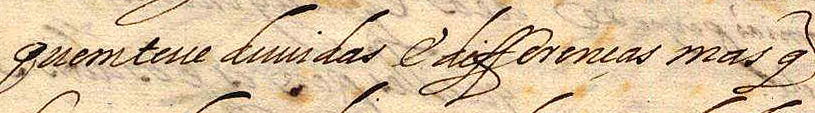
quem teue duuidas e differenças, mas q̄
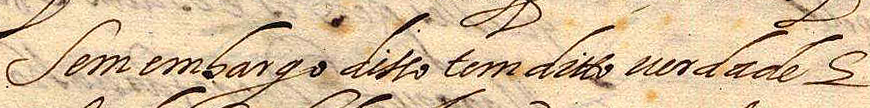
sem embargo disso tem ditto uerdade E
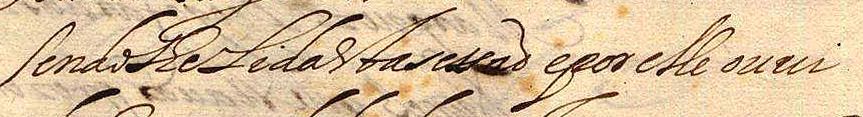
sendolhe Lida esta sessão e por elle ouui
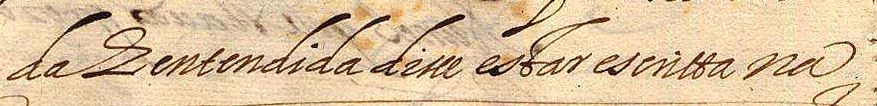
da E entendida disse estar escritta na
